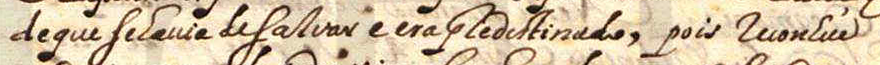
de que se hauia de salvar e era pRedestinado, pois Reconhece
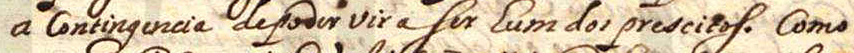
a contingencia de poder vir a ser hum dos prescitos. Como
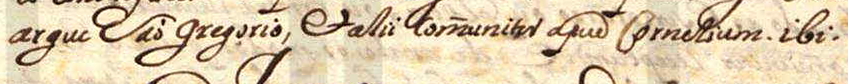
argue Saõ Gregorio, & alii com̄uniter apud Cornelium. ibi.
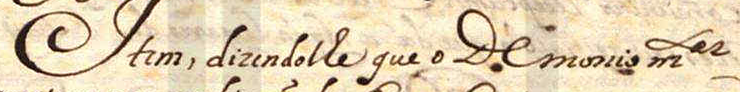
Item, dizendolhe que o Demonio mtaz
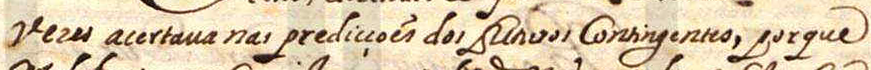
vezes acertaua nas predicçoẽs dos funeros Contingentes, porque
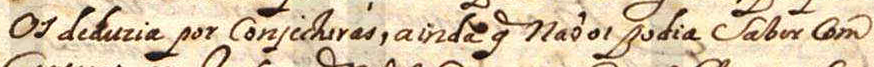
Os deduzia por conjecturas, ainda q̄ naõ os podia Saber Com
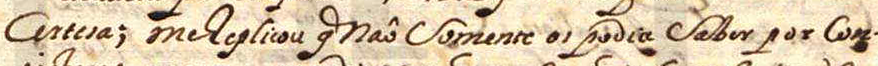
Certesa; me Replicou q̄ naõ Somente os podia Saber por Con
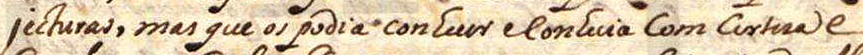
jecturas, mas que os podia conhecer e conhecia com certeza e
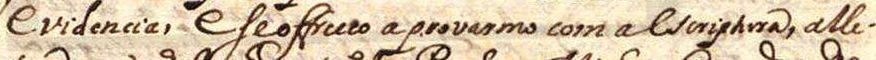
Evidencia, E se offreceo aprovarmo com a Escriptura, alle
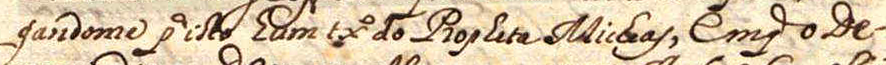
gandome pa isto hum txo do Propheta Micheas, Em q̄ o De
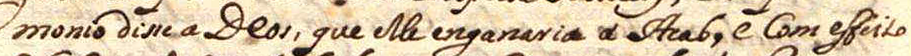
monio disse a Deos, que elle enganaria a Acab, e com effeito
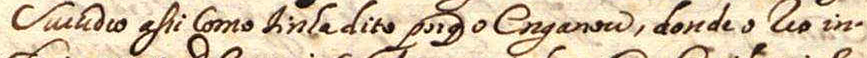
Succedeo assi como tinha dito porq̄ o Enganou, donde o Reo in
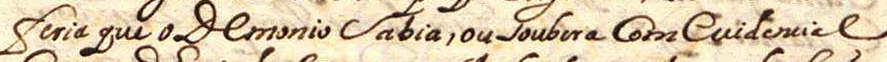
feria que o Demonio Sabia, ou soubera Com Euidencia E
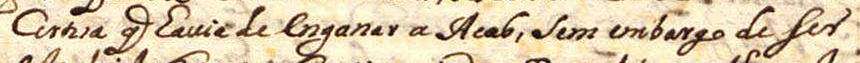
Certesa q̄ hauia de enganar a Acab, sem embargo de ser
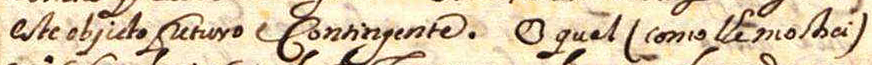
este objecto futuro e Contingente. O qual (como lhe mostrei)
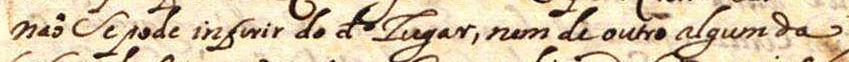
naõ Se pode inferir do d̄o Lugar, nem de outro algum da
